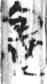表
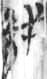○（飾）
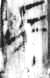倀（長）
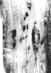子
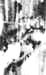吉
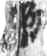幽（幼）
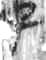子
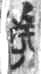者
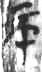不
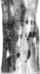吉
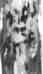○（帶）
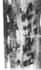鐱（劍）
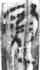○（冠）
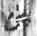㠯（以）
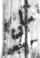生
